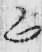㠯（以）
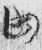○（廷）
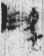阩
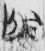門
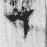又（有）
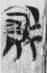敗
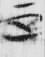正
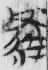羅
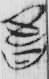𠷎（壽）
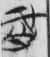戠
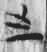之
